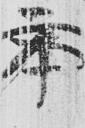不
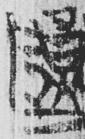○（隕）
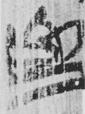爲
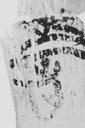善
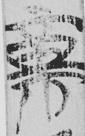福
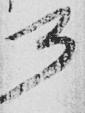乃
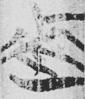○（來）
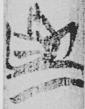爲
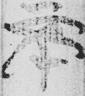不
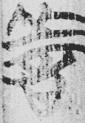善
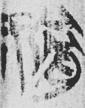○（禍）
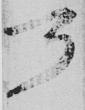乃
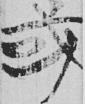或（惑）
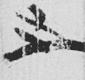之
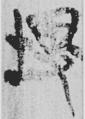○（卑）
